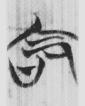命
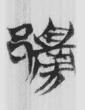{臱阝}
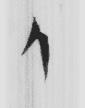人
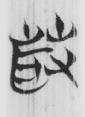{艹取}
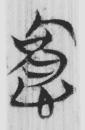{肙心}
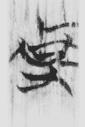弁
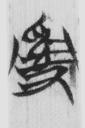𤔔
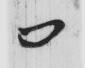厶
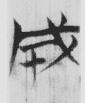成
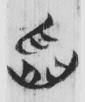舀
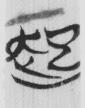起
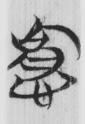{肙心}
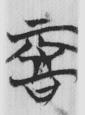{亞口}
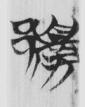{臱阝}
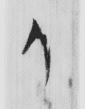人
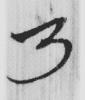乃
